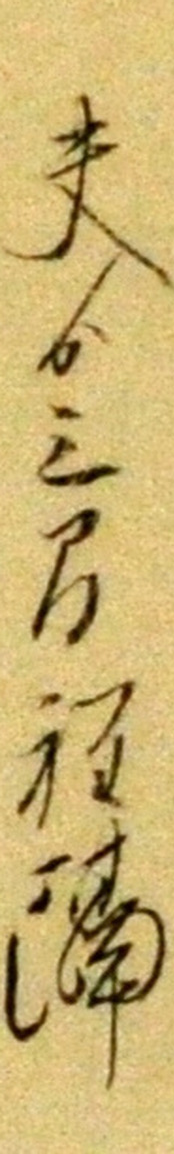夫ゟ三間程隔
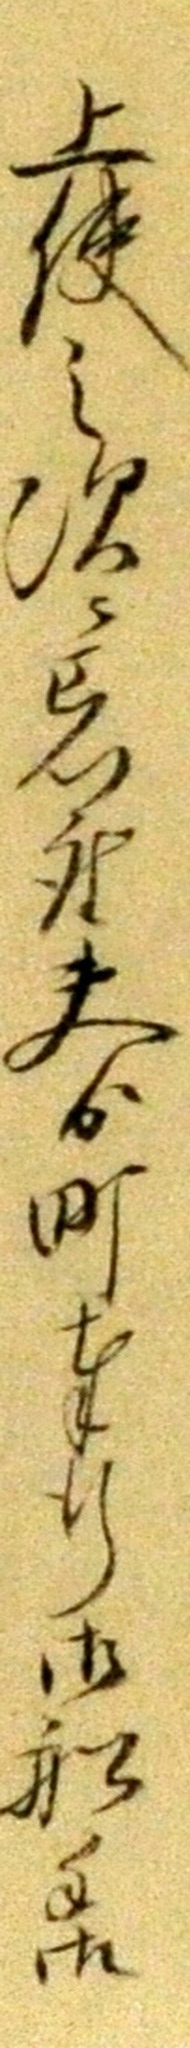上使之次ニ着座夫ゟ町奉行御船手御
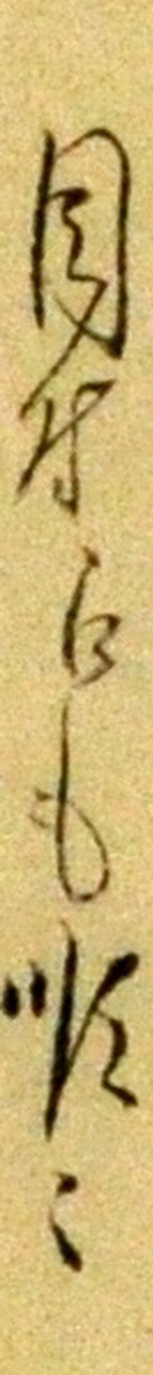目付えも順々
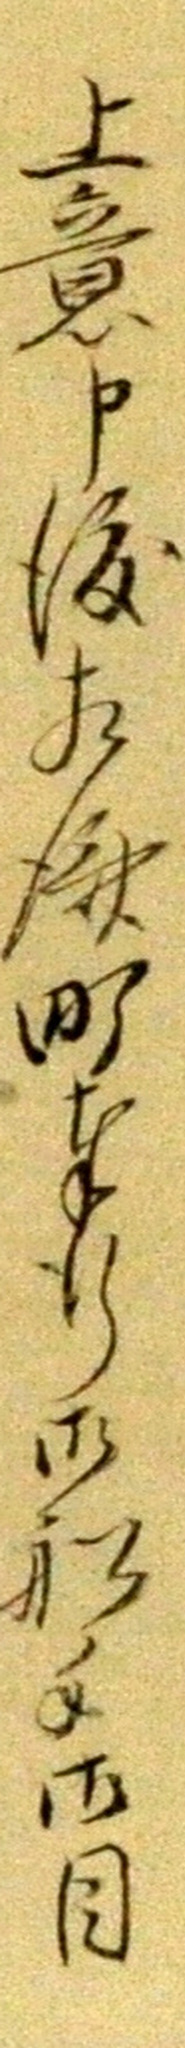上意申渡相済町奉行御船手御目
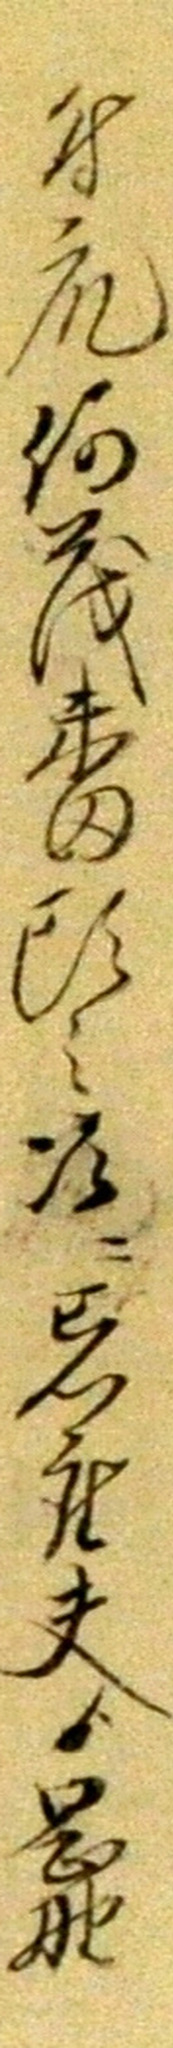付衆何も番頭之次ニ着座夫ゟ岡野
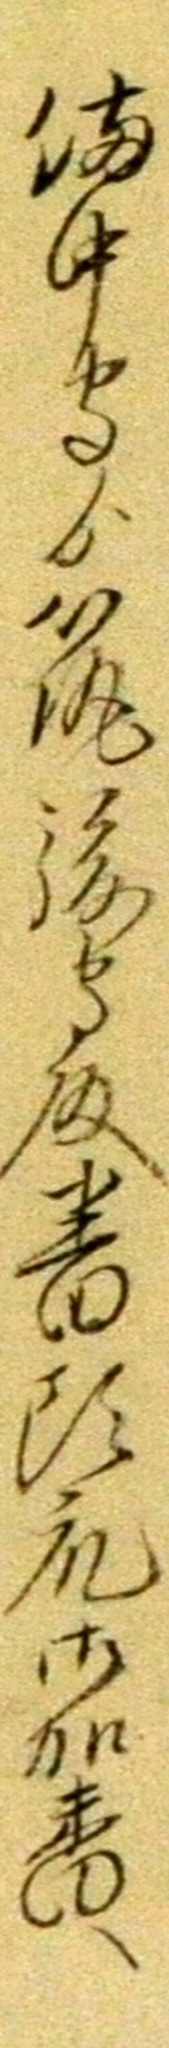備中守ゟ筑後守殿番頭衆御加番へ
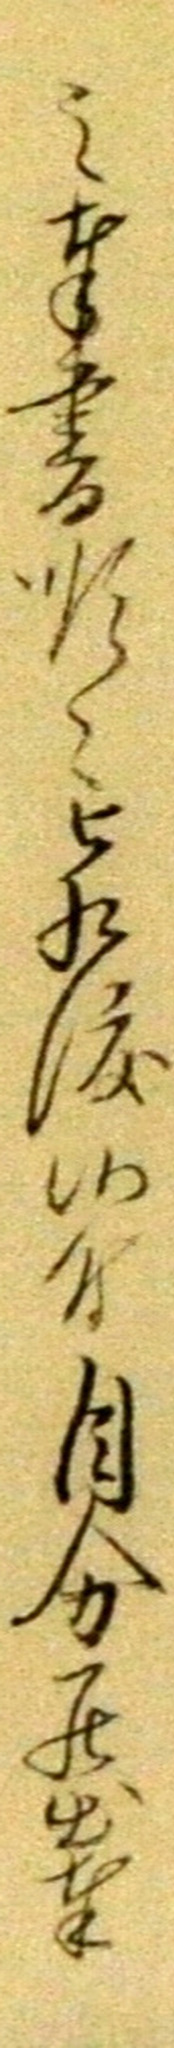之奉書順々被相渡候付自分罷出奉
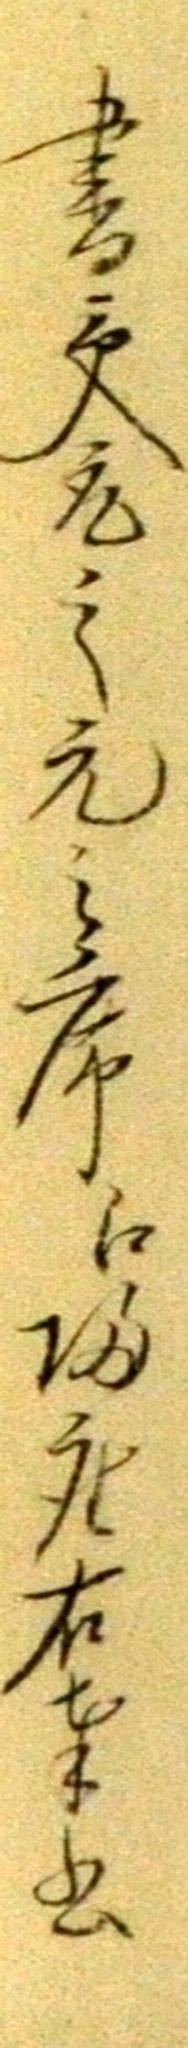書受取之元之席え帰座右奉書

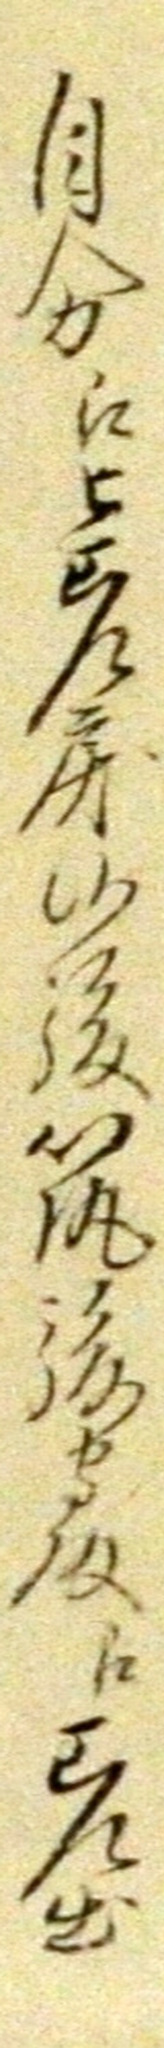自分え被差戻候後筑後守殿え差出
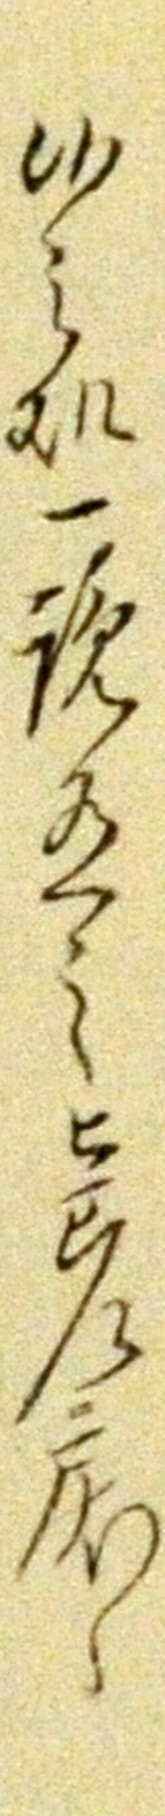候之処一覧有之被差戻候
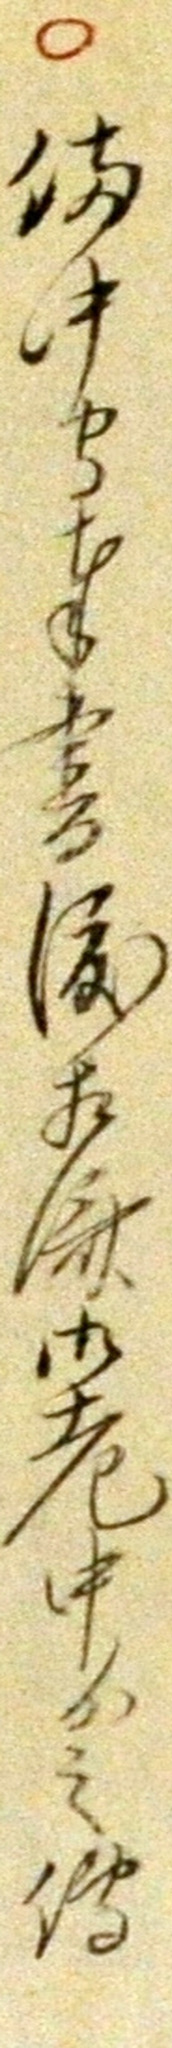備中守奉書渡相済御老中ゟ之伝
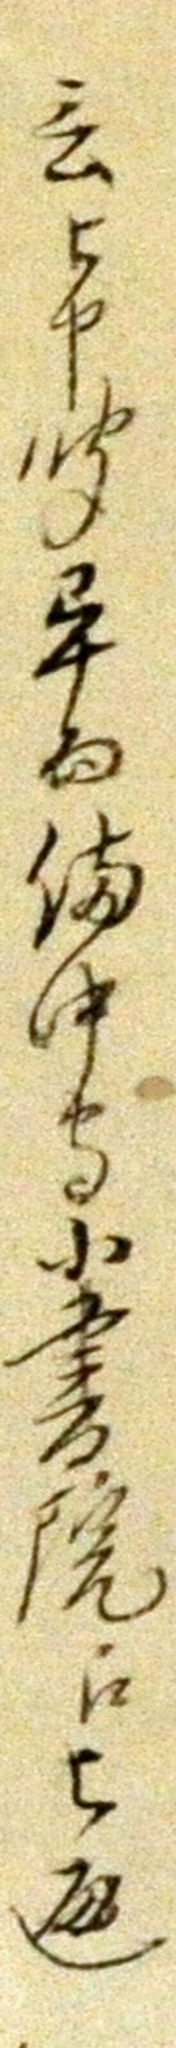言被申聞畢而備中守小書院え被通
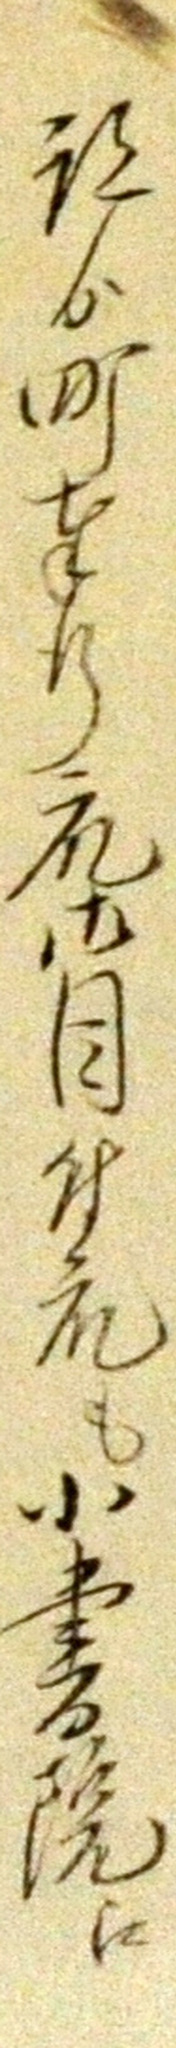跡ゟ町奉行衆御目付衆も小書院え
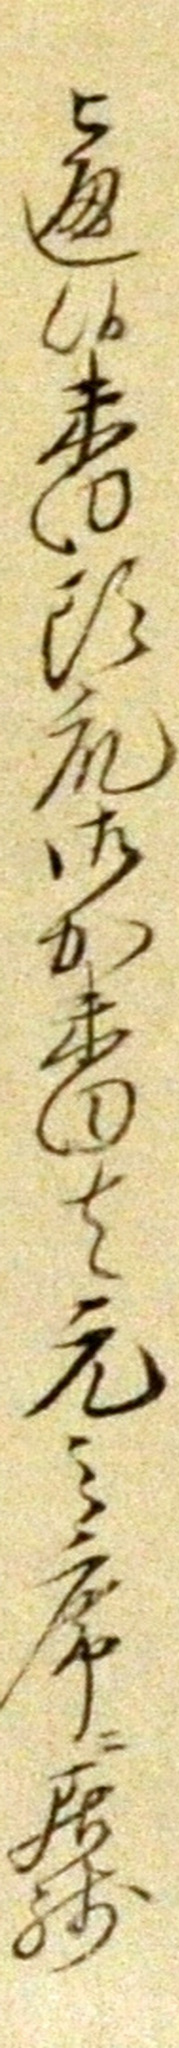被通候番頭衆御加番は元之席ニ居残
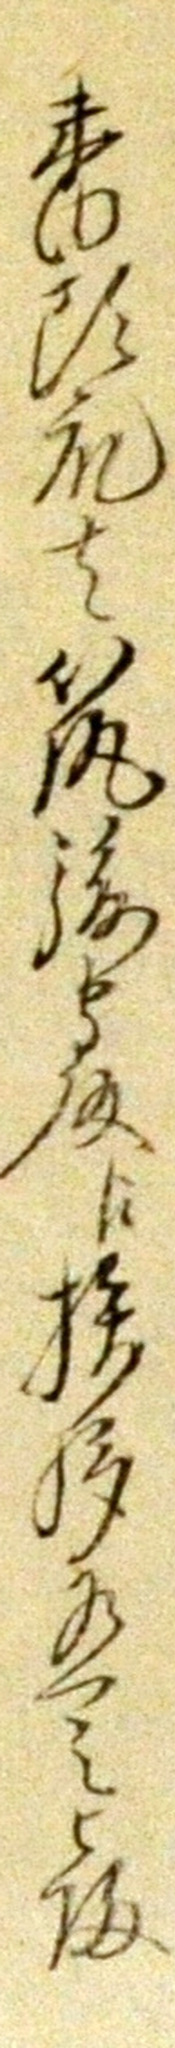番頭衆は筑後守殿え挨拶有之被帰
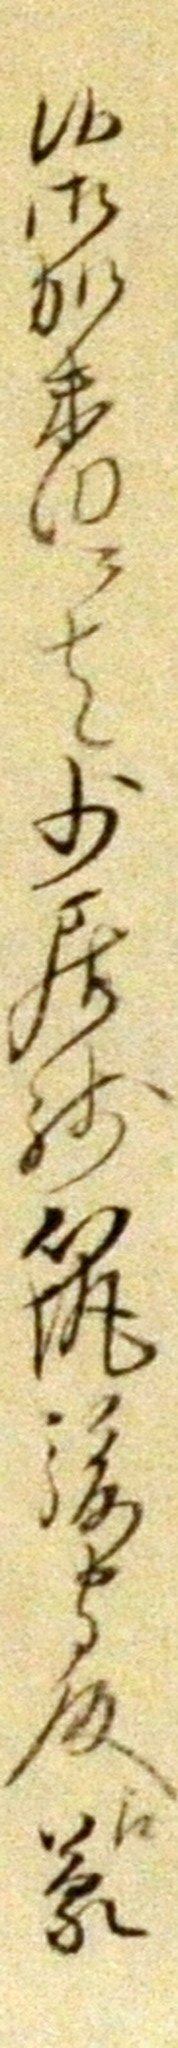候御加番ニは少居残筑後守殿え蒙
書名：大阪加番関係諸書留〔一括〕
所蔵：伊那市立高遠町図書館・合同会社AMANE
